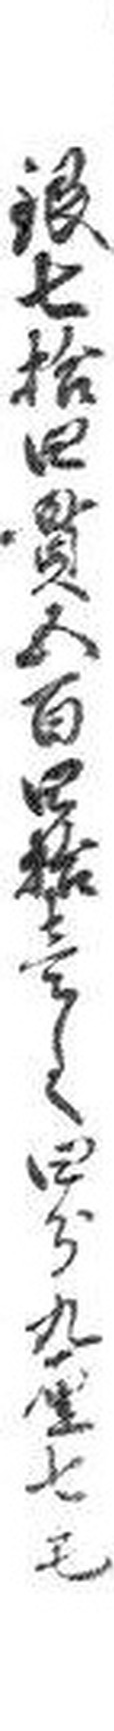銀七拾四貫五百四拾壱匁四分九厘七毛
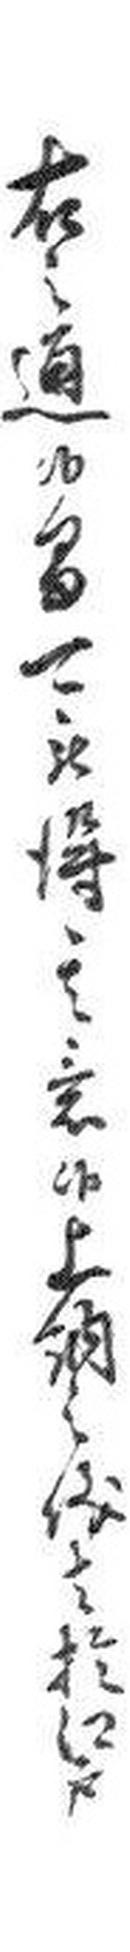右之通候間可被得其意候上納之儀者於江戸
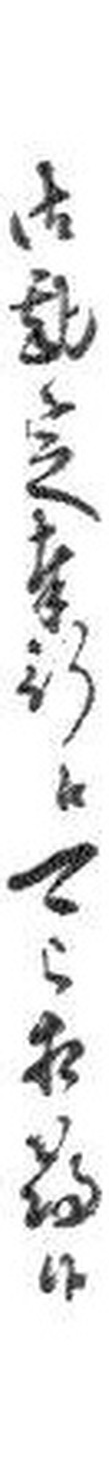御勘定奉行江可被相尋候
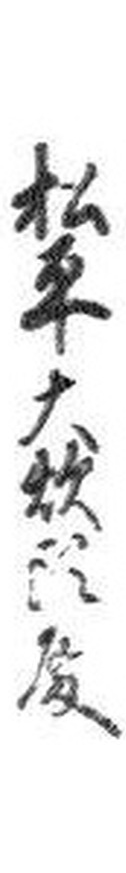松平大炊頭殿
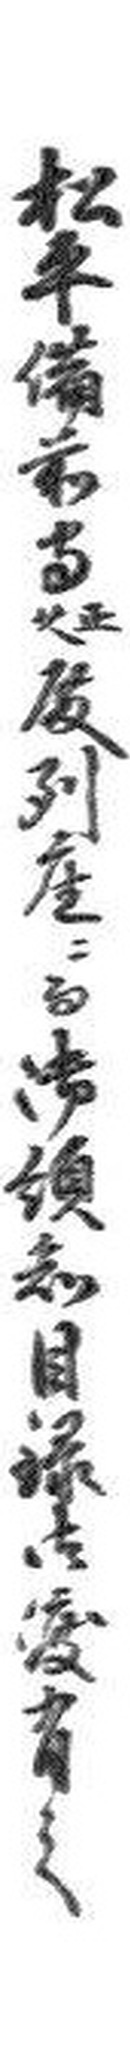松平備前守正久殿列座ニ而御領知目録御渡有之
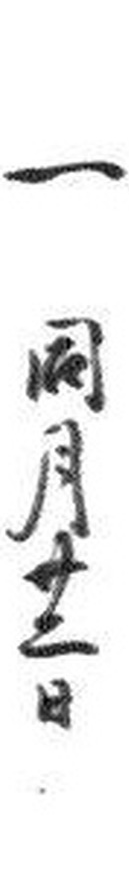一同月廿二日
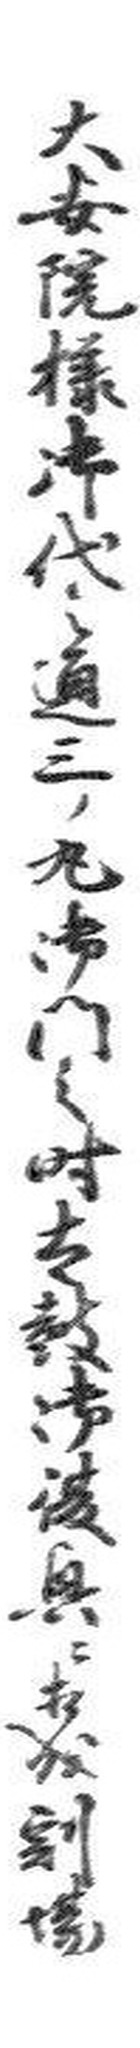大安院様御代之通三ノ丸御門之時太鼓御復興ニ相成割場
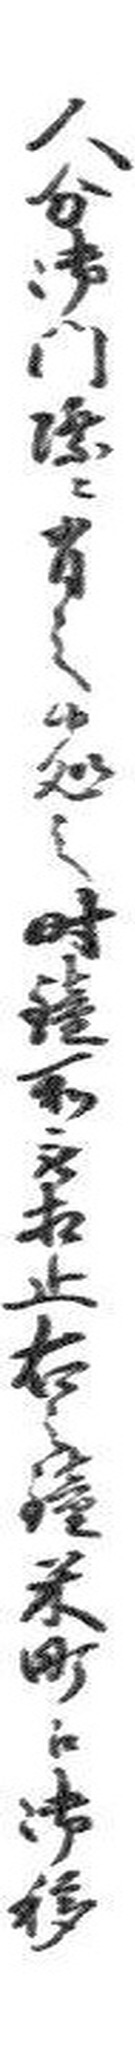人分御門際ニ有之候処之時鐘所被相止右之鐘米町江御移
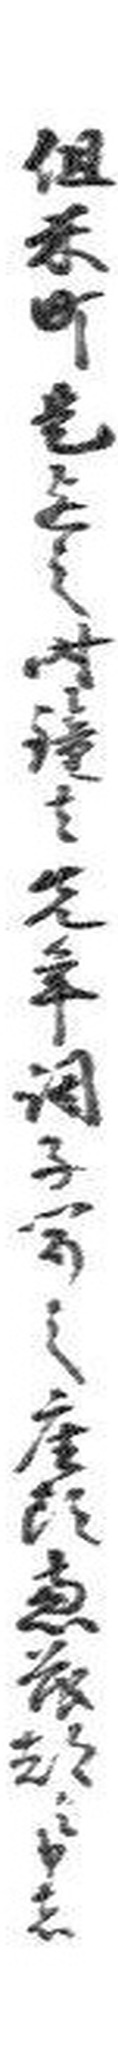但米町是迄之時鐘者先年調子聞之座頭恵茂都与申者
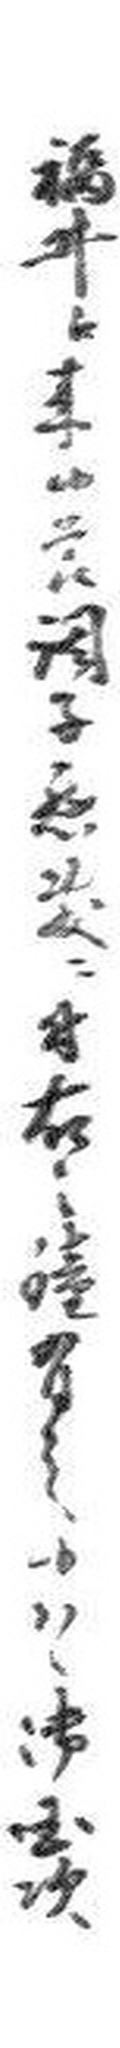福井江来候節調子悪敷ニ付右之鐘有之候ハヽ御国次
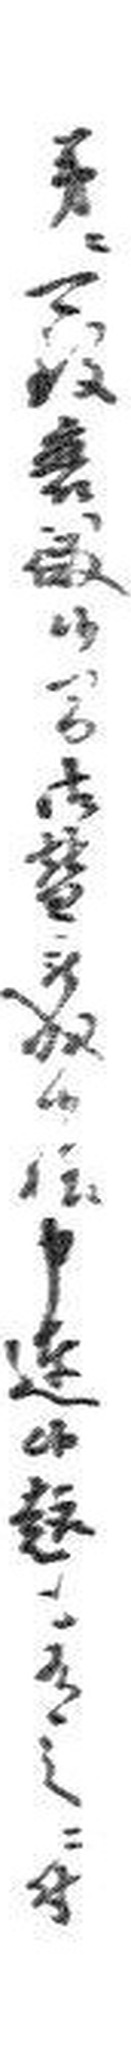第ニ致衰微候間御替被成候様申達候趣も有之ニ付

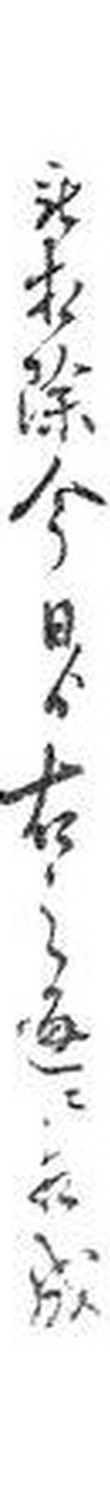被相除今日ゟ右之通ニ相成
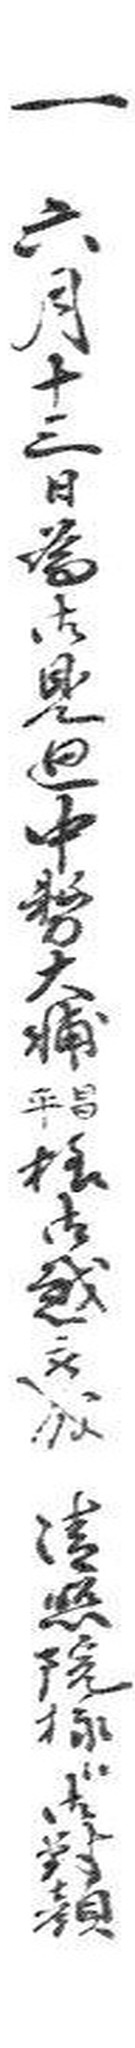一六月十三日為御見廻中務大輔昌平様御越被成清照院様江御対顔
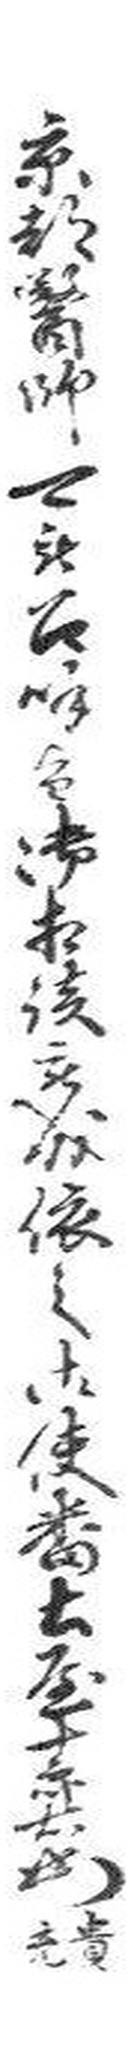京都医師可被召呼旨御相談被成依之御使番土屋十郎右衛門貴充
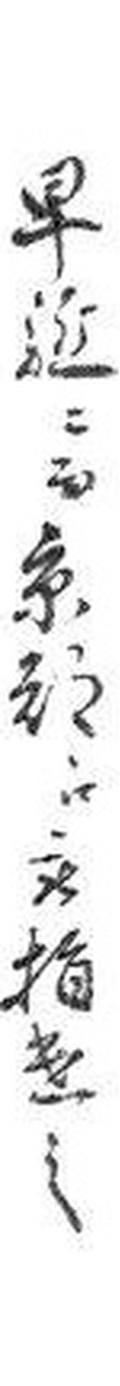早駈ニ而京都江被指遣之
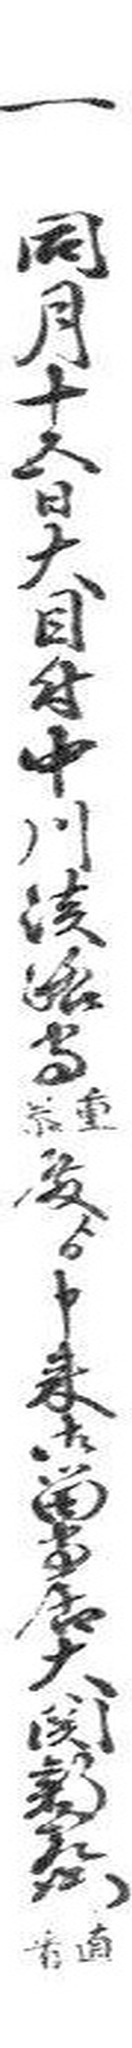一同月十五日大目付中川淡路守重恭殿ゟ申来御留守居大関新五左
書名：家譜 二十九 吉邦公 従正徳二年到正徳三年
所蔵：福井県文書館 Fukui Prefectural Archives
